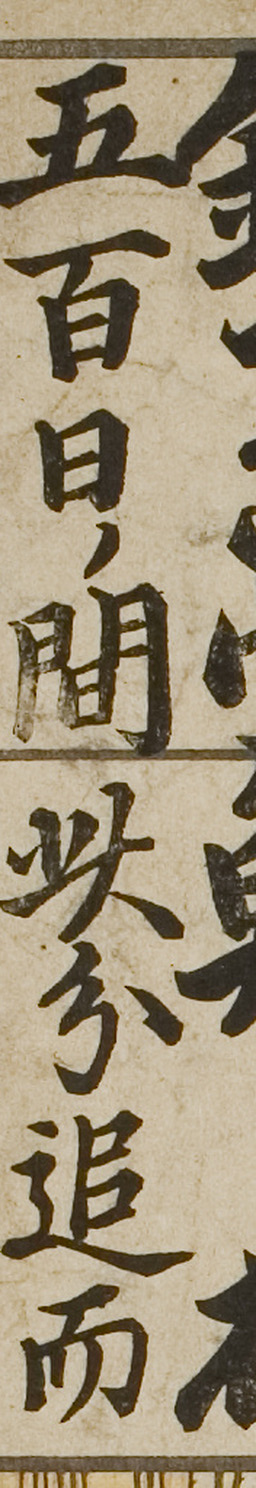五百日ノ間此分追而
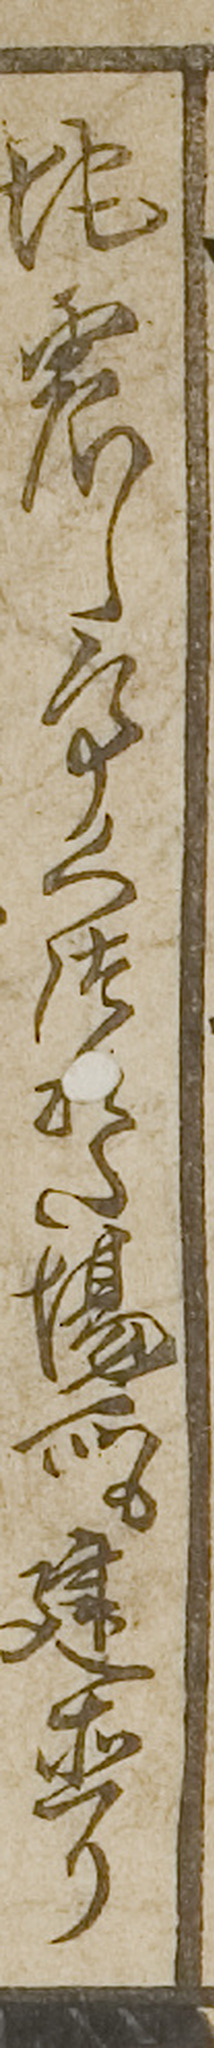地震くつかた場所も建直り
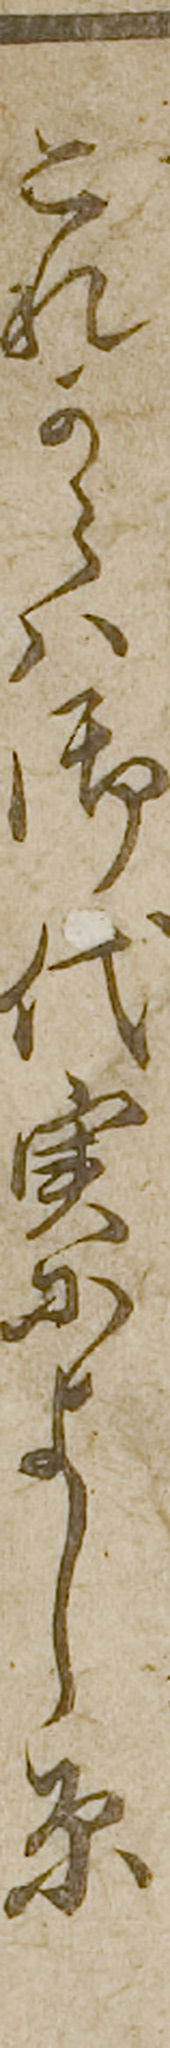これからハ御代実によし原
